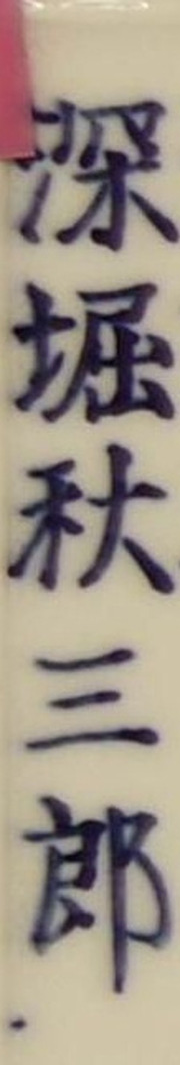深堀秋三郎

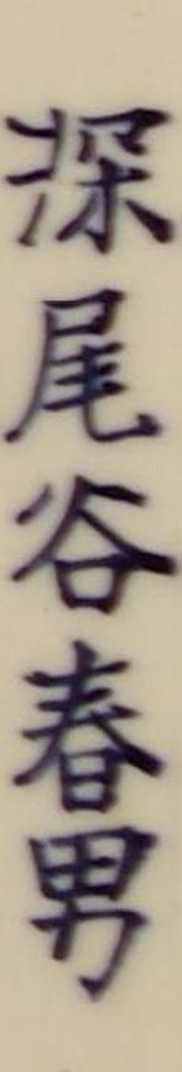深尾谷春男
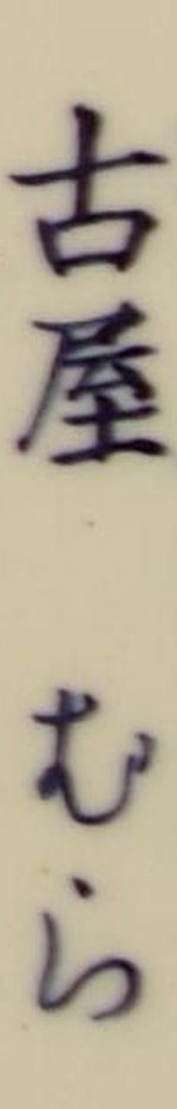古屋むら
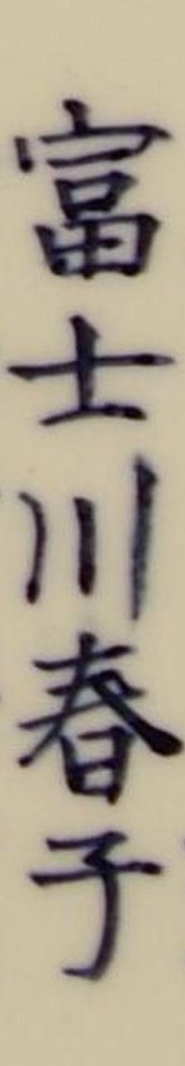富士川春子
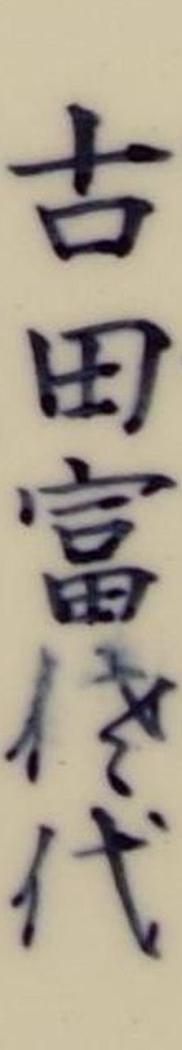古田富佐代
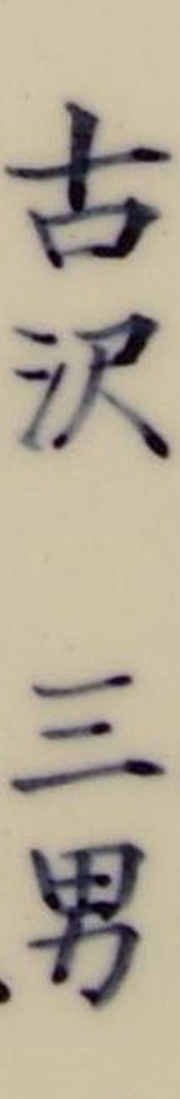古沢三男
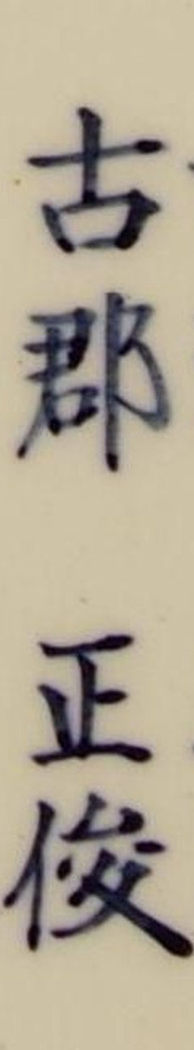古郡正俊
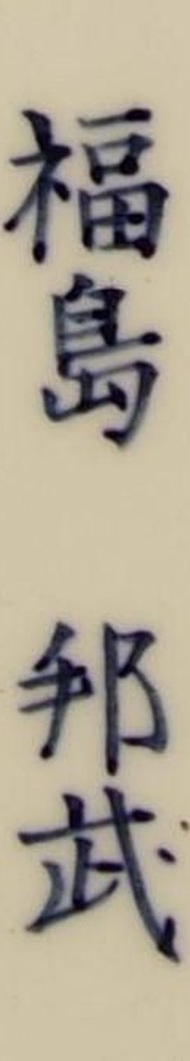福島邦武
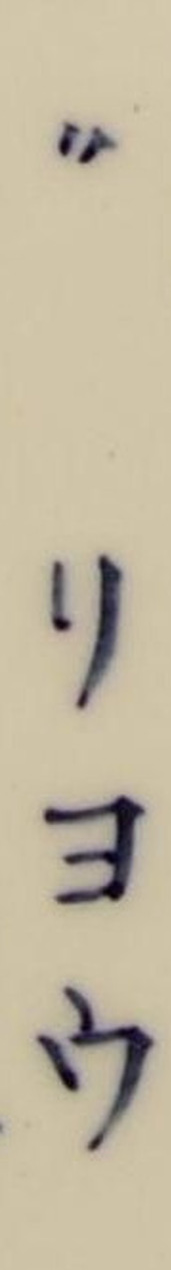リヨウ
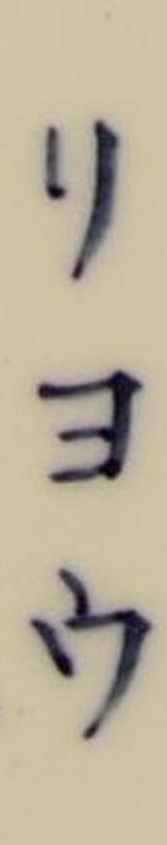リヨウ
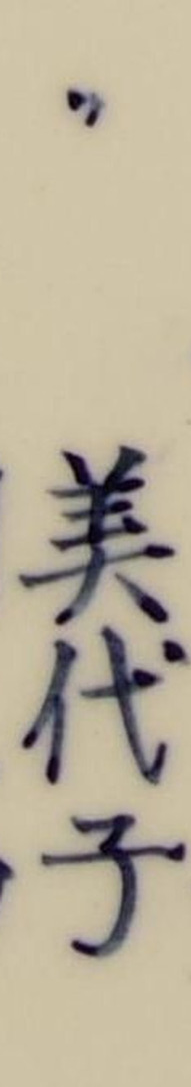美代子
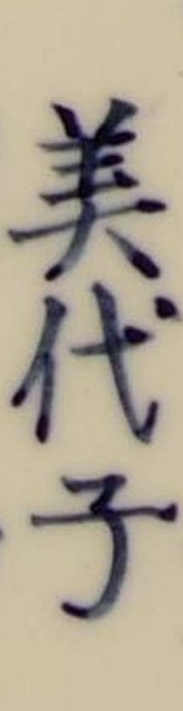美代子
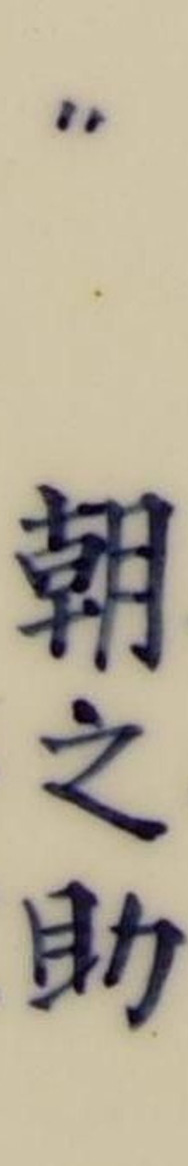朝之助
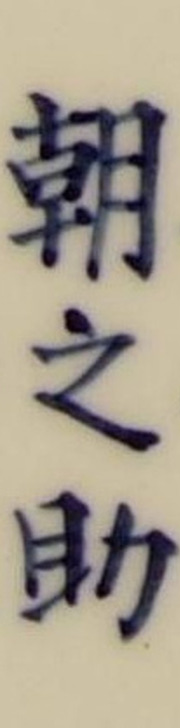朝之助
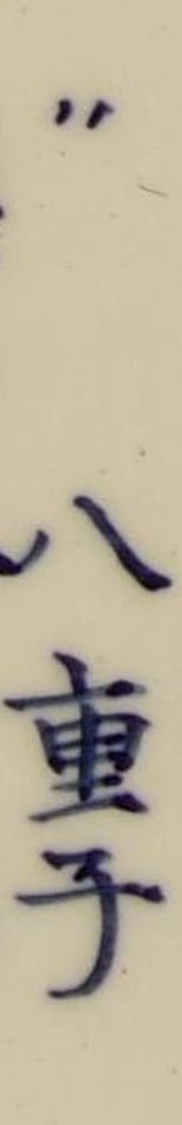八重子
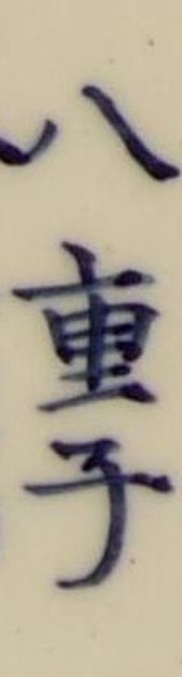八重子
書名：E~L
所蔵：高野山金剛峯寺
